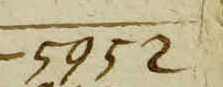5952
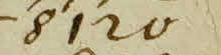8120
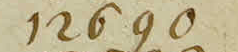12690
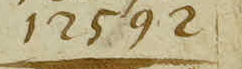12592
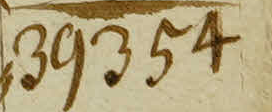39354
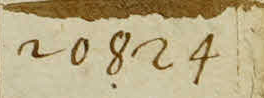20824
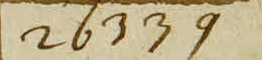26339
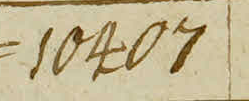10407
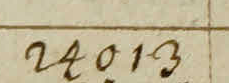24013
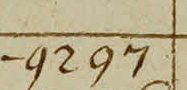9297
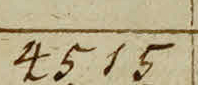4515
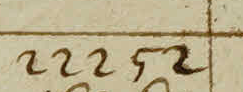22252
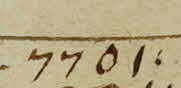7701
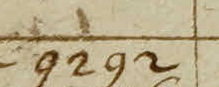9292
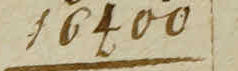16400
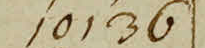10136
